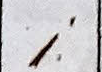1.
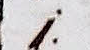1.
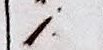1.
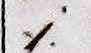1.
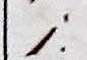1
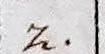2.
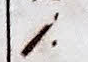1.
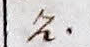2
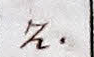2.
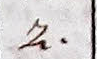2.
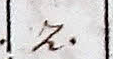2.
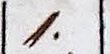1.
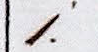1.
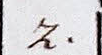2.
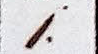1.
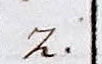2.
